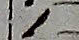1
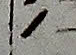1
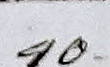40
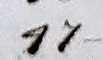47
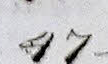47
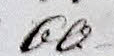60
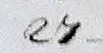27
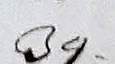34
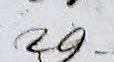29
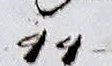44
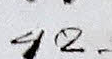42
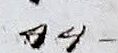44
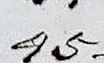45
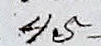45
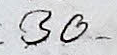30
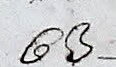63
